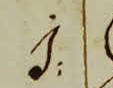1:
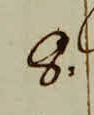8
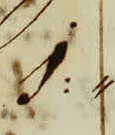1:
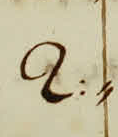2:
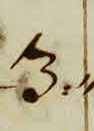3:
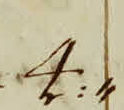4:
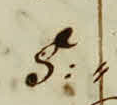5:
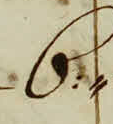6:
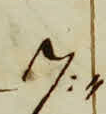7:
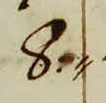8:
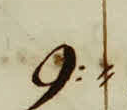9:
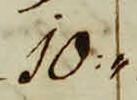10:
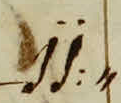11:
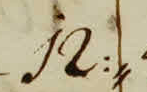12:
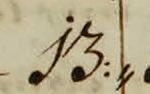13:
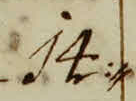14:
